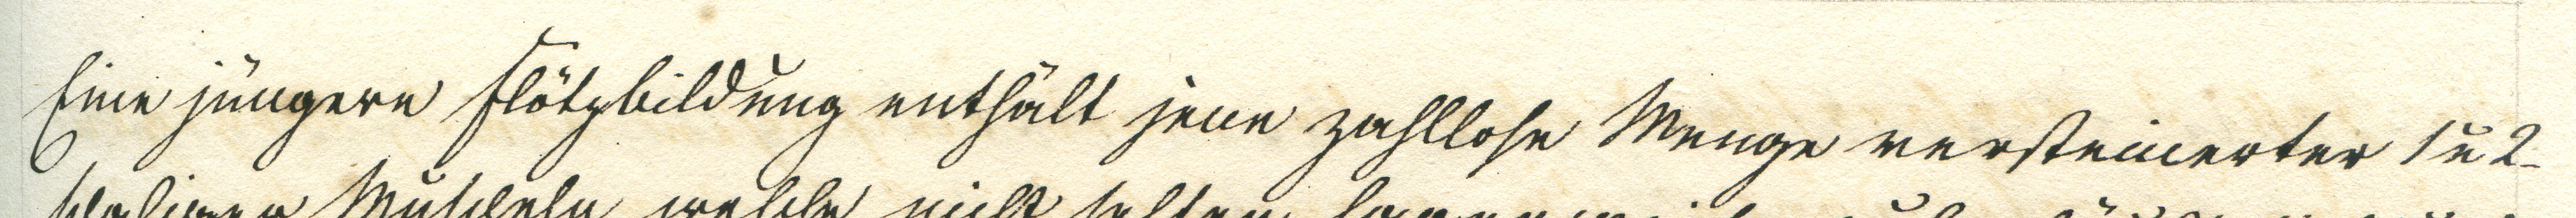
Eine jüngere Flötzbildung enthält jene zahllose Menge versteinerter 1 u 2
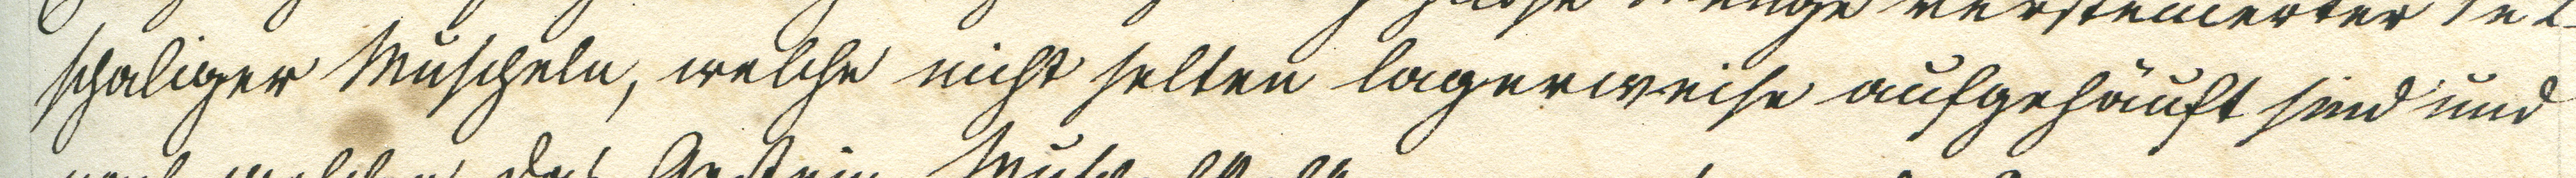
schaliger Muscheln, welche nicht selten lagenweise aufgehäuft sind und
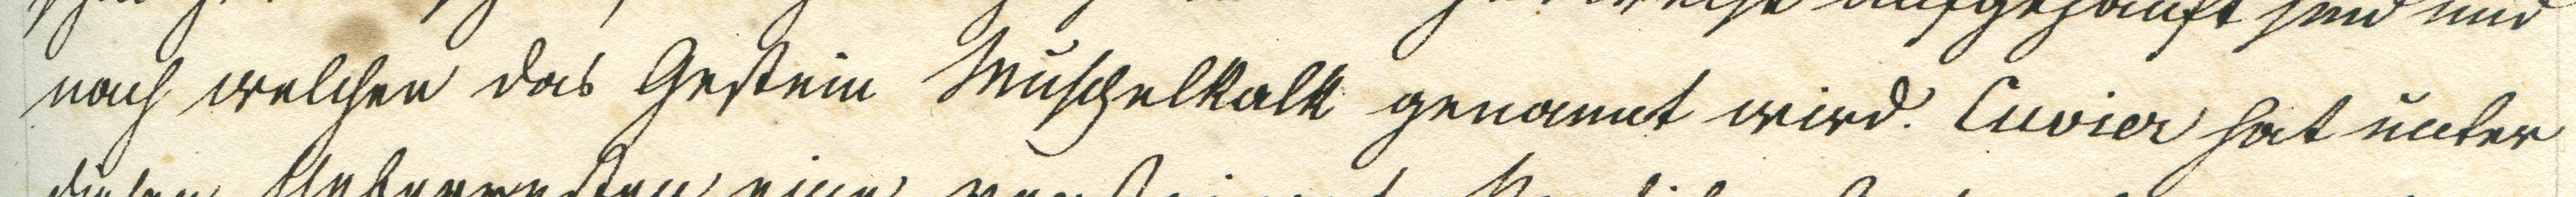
nach welchen das Gestein Muschelkalk genannt wird. Cuvier hat unter
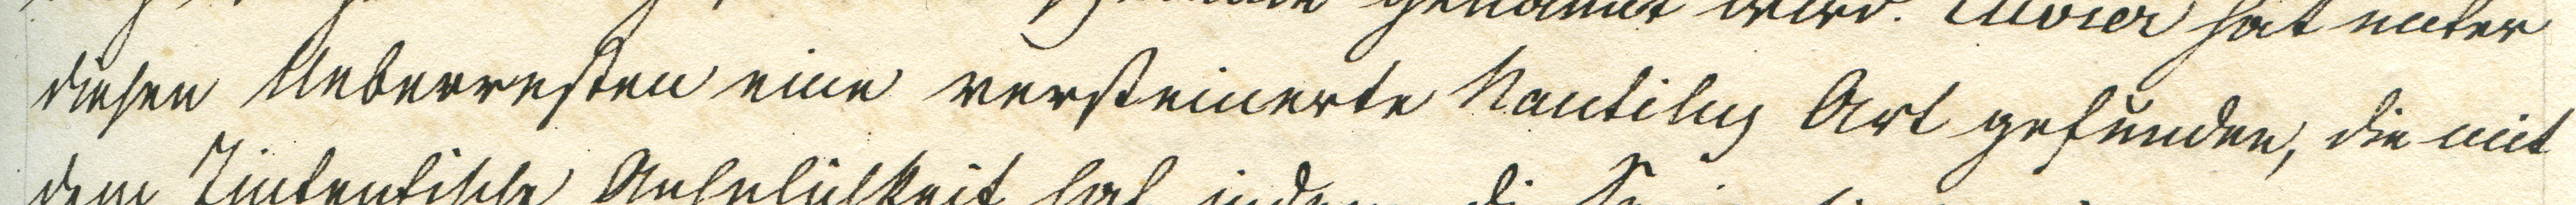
diesen Ueberresten eine versteinerte Nautilus Art gefunden, die mit
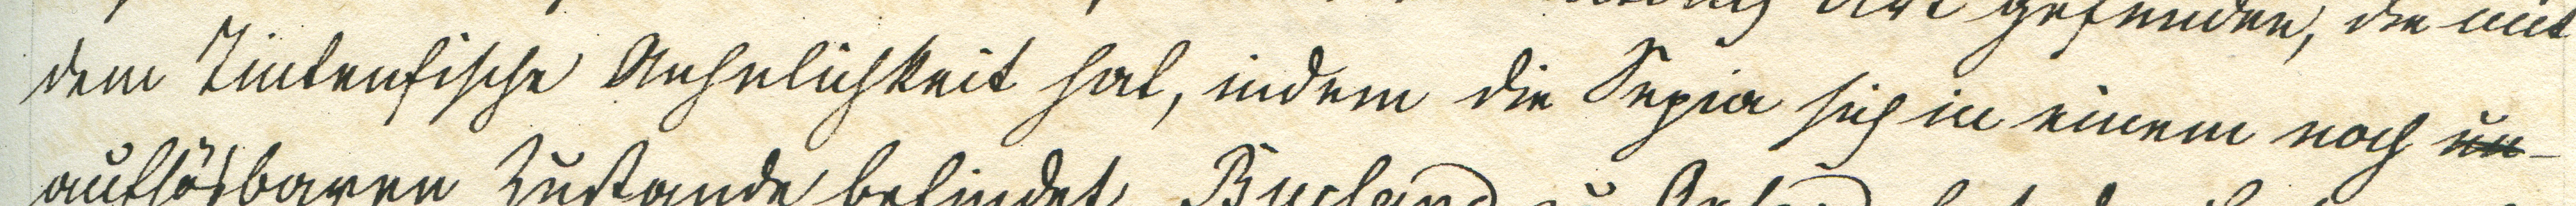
dem Tintenfische Aehnlichkeit hat, indem die Sepia sich in einem noch un-
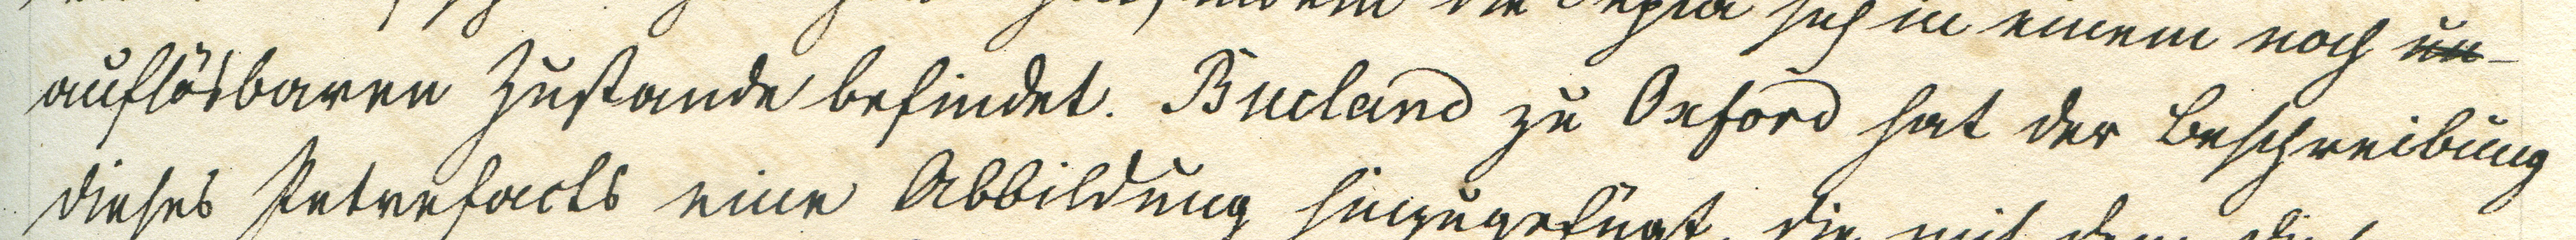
auflösbaren Zustande befindet. Bucland zu Oxford hat der Beschreibung
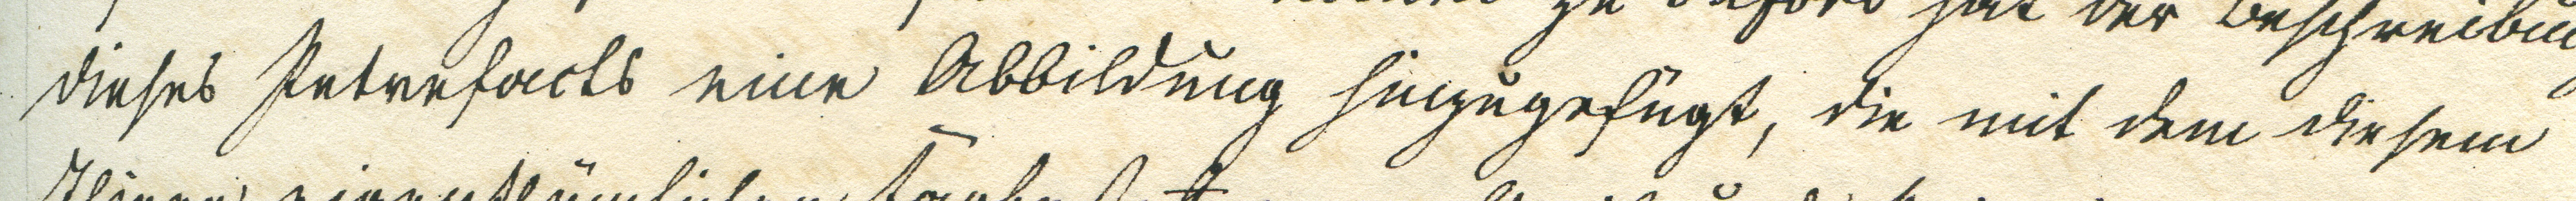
dieses Petrefacts eine Abbildung hinzugefügt, die mit dem diesem
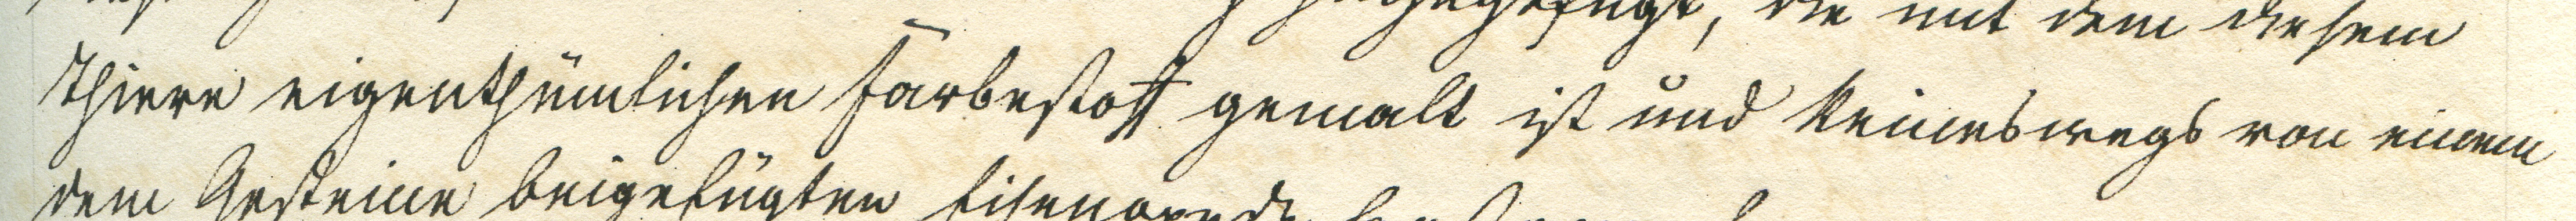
Thiere eigenthümlichen Färbestoff gemalt ist und keineswegs etwa von einem
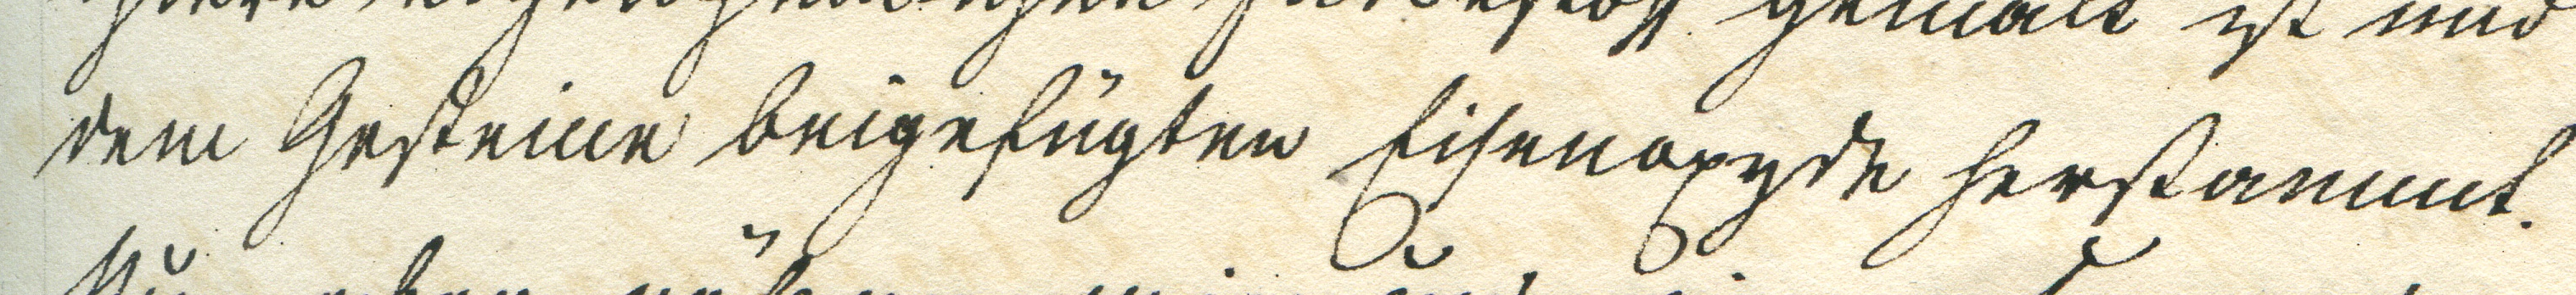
dem Gestein beigefügten Eisenoxyde herstammt.
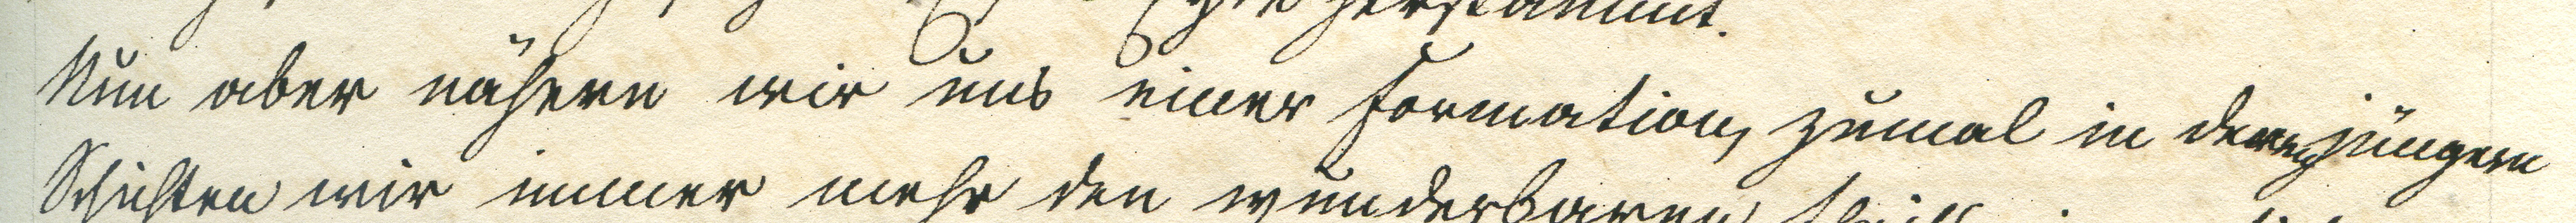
Nun aber nähern wir uns einer Formation, zumal in denren jüngeren
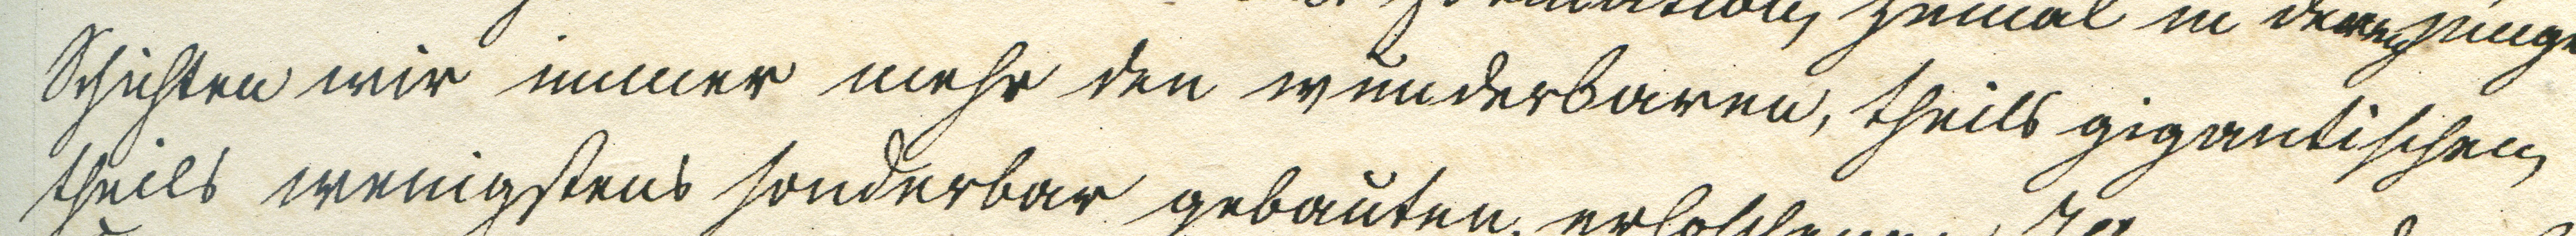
Schichten wir immer mehr den wunderbaren, theils gigantischen,
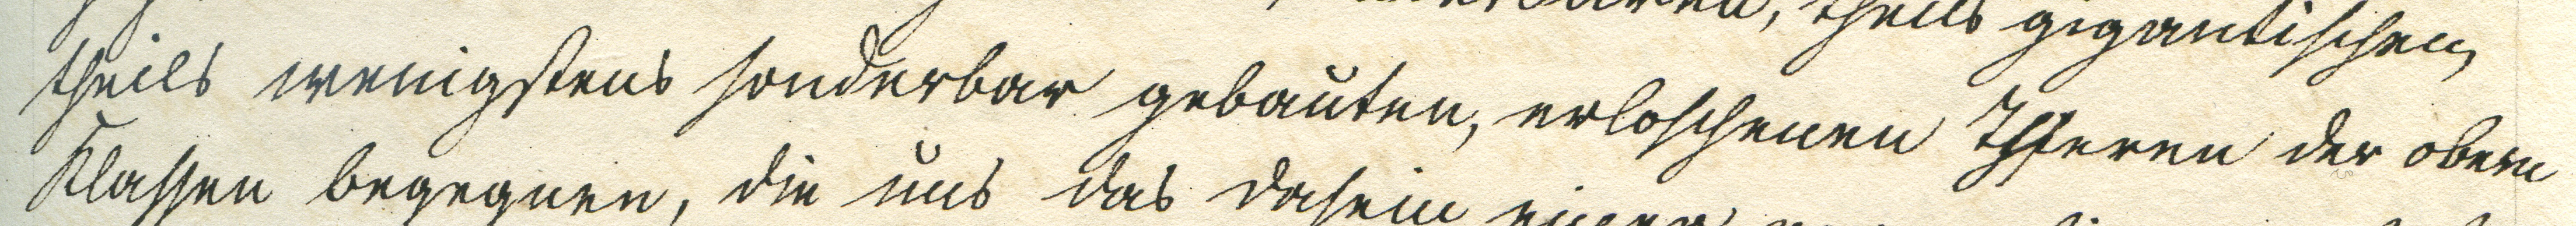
theils wenigstens sonderbar gebauten, erloschenen Thieren der obern
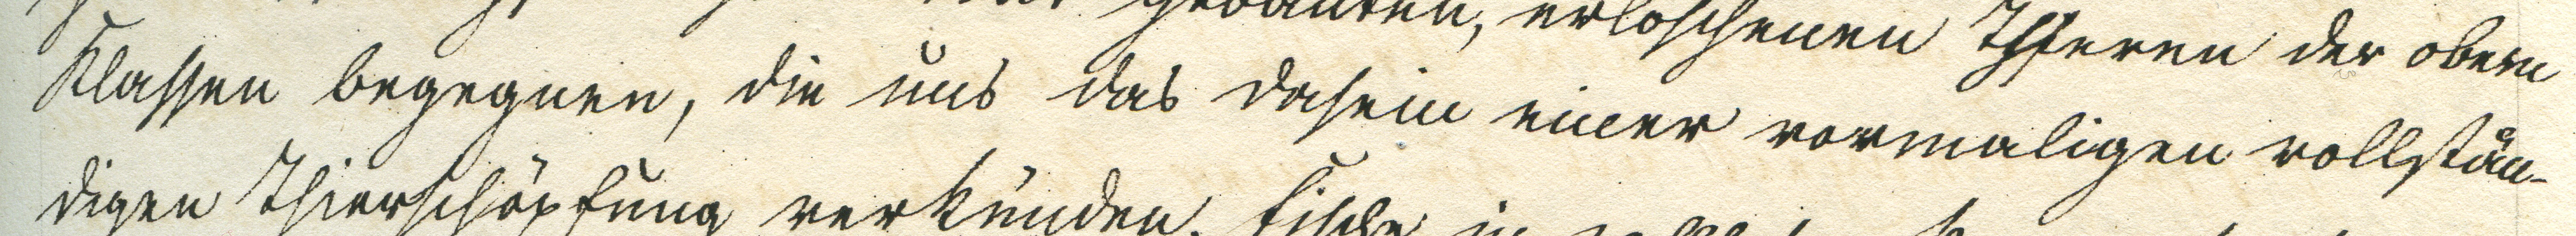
Klassen begegnen, die uns das Dasein einer vormaligen vollstän-
